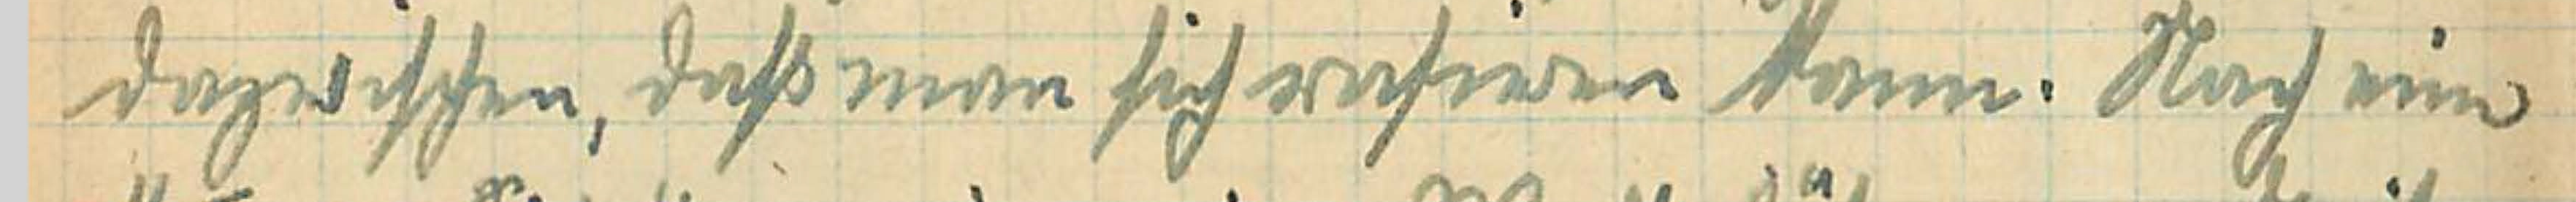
dazwischen, daß man sich rasieren kann. Nach einer
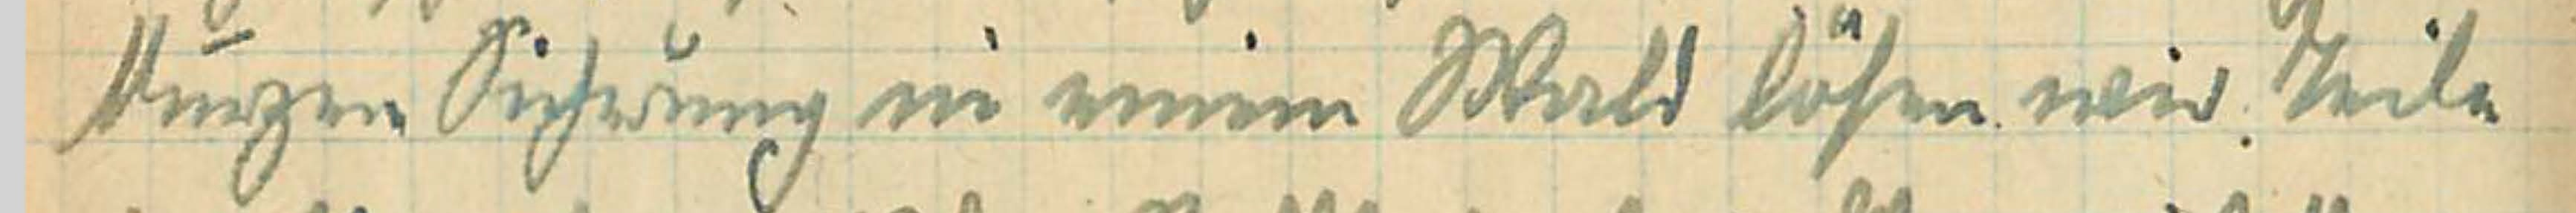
kurzen Sicherung in einem Wald lösen wir Teile
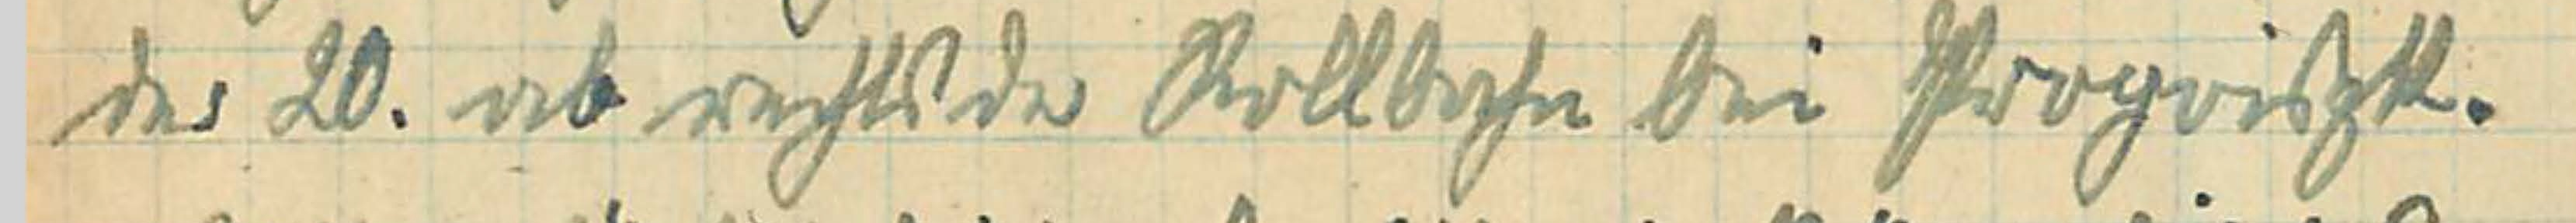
der 20. ab rechts der Rollbahn bei Propoiszk.
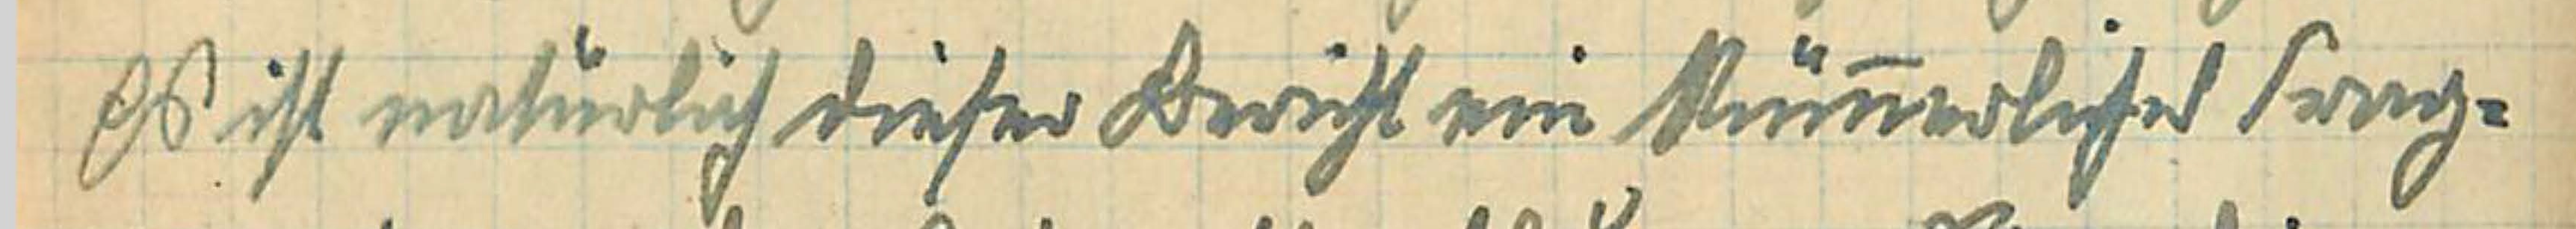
Es ist natürlich dieser Bericht ein kümmerliches Frag-
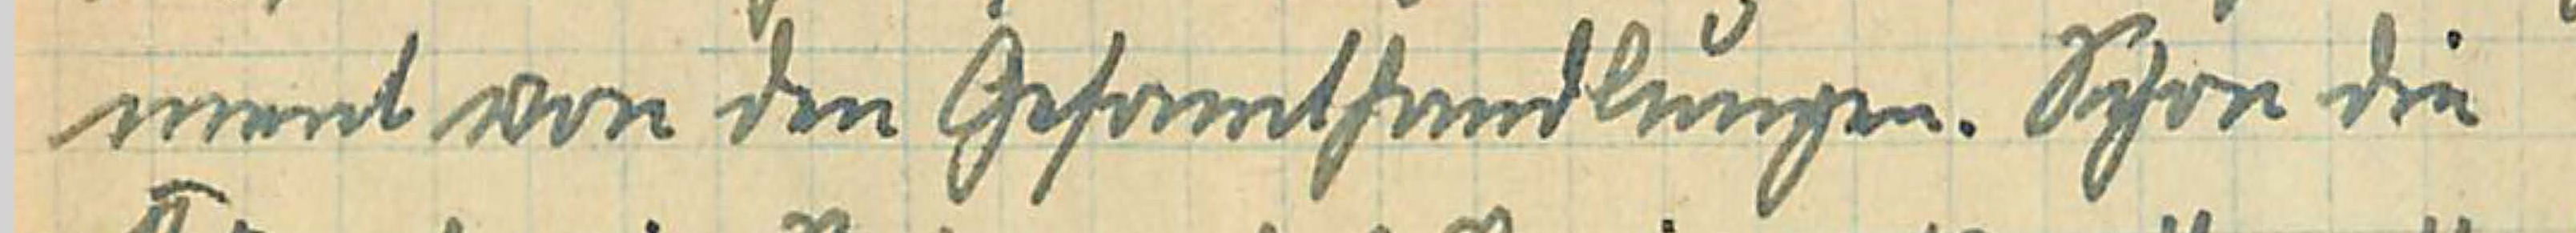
ment von den Gesamthandlungen. Schon die
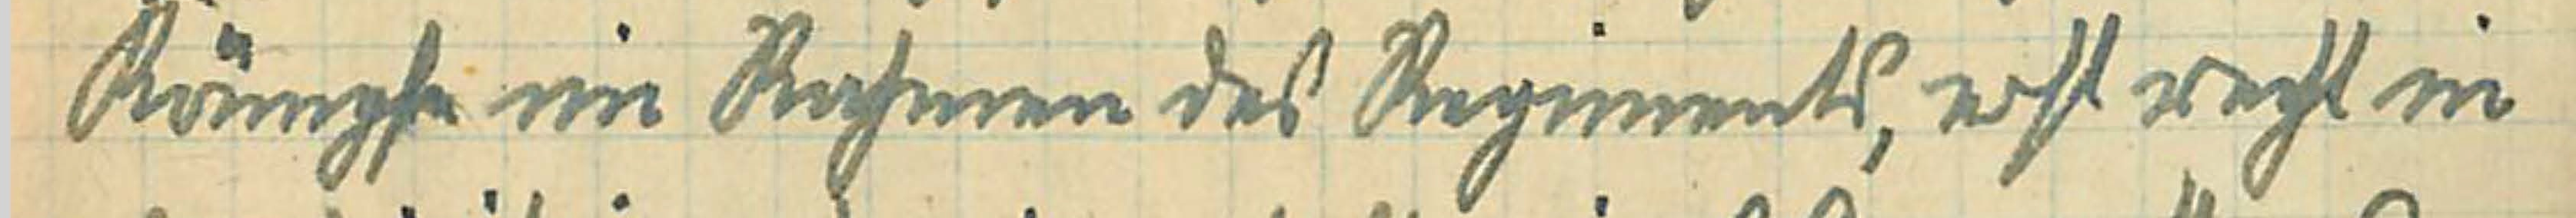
Kämpfe im Rahmen des Regiments, erst recht in
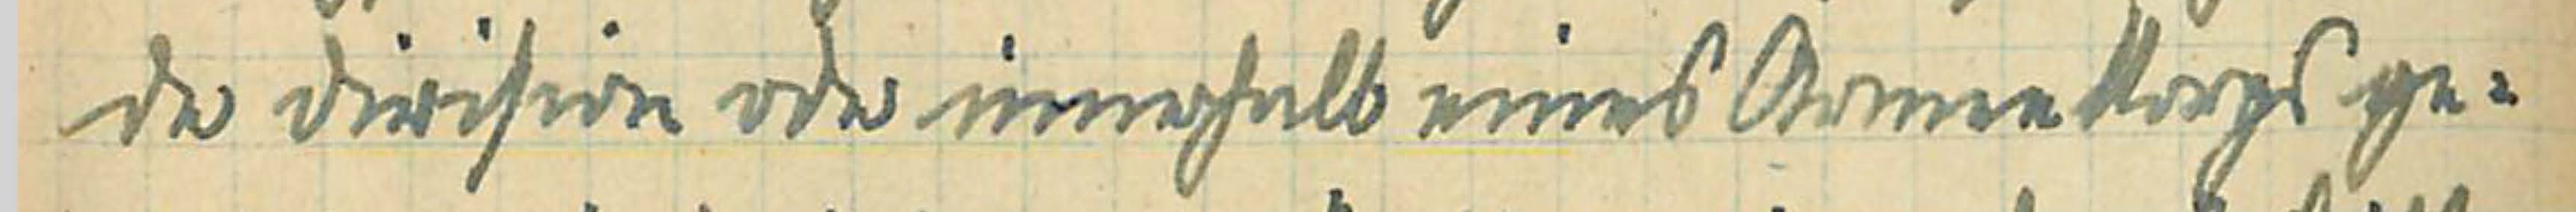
der Division oder innerhalb eines Armeekorps ge-
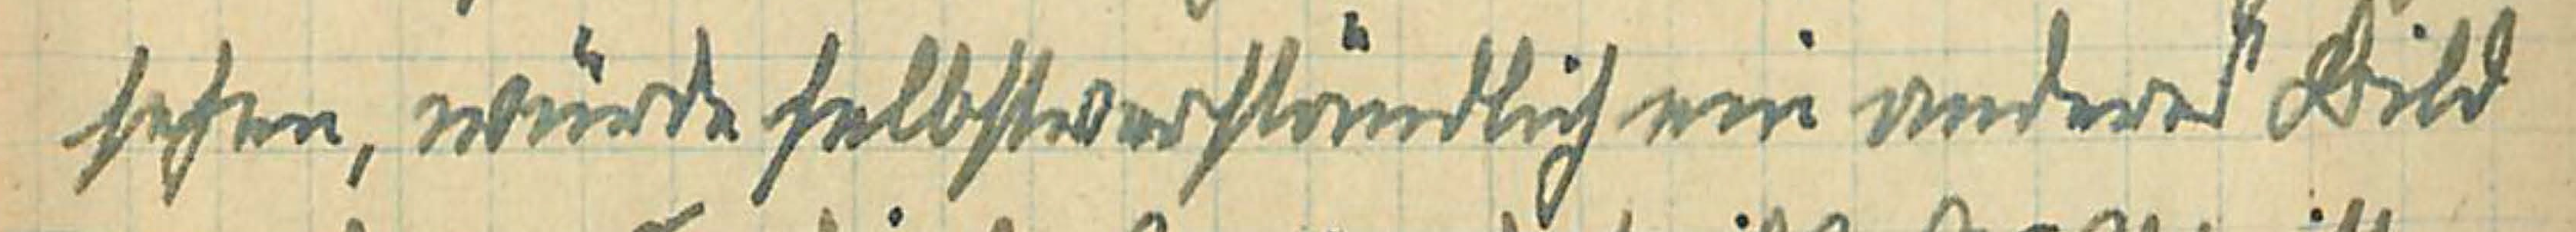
sehen, würde selbstverständlich ein anderes Bild
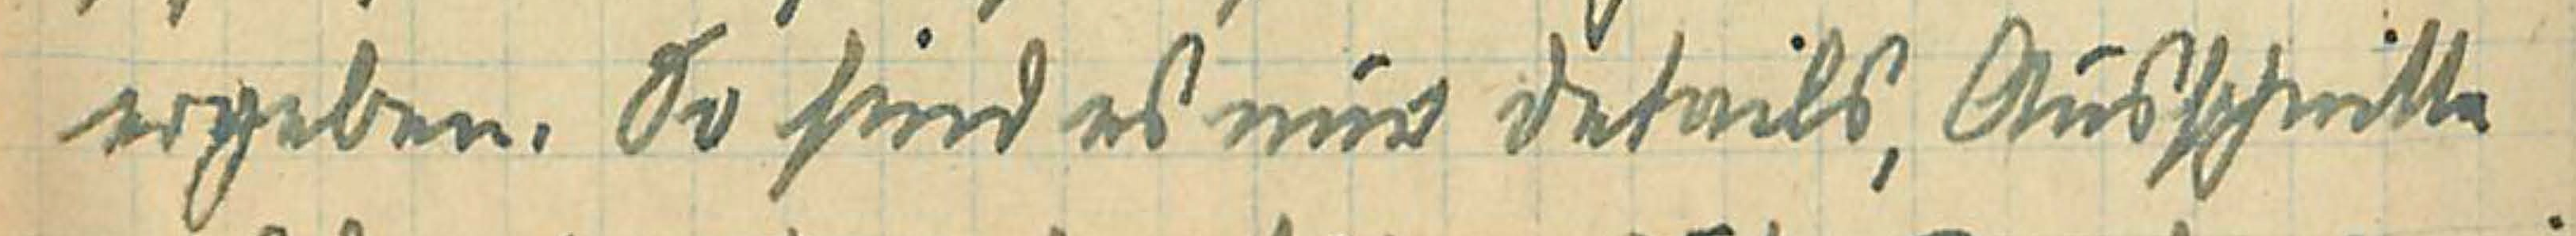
ergeben. So sind es nur Details, Ausschnitte
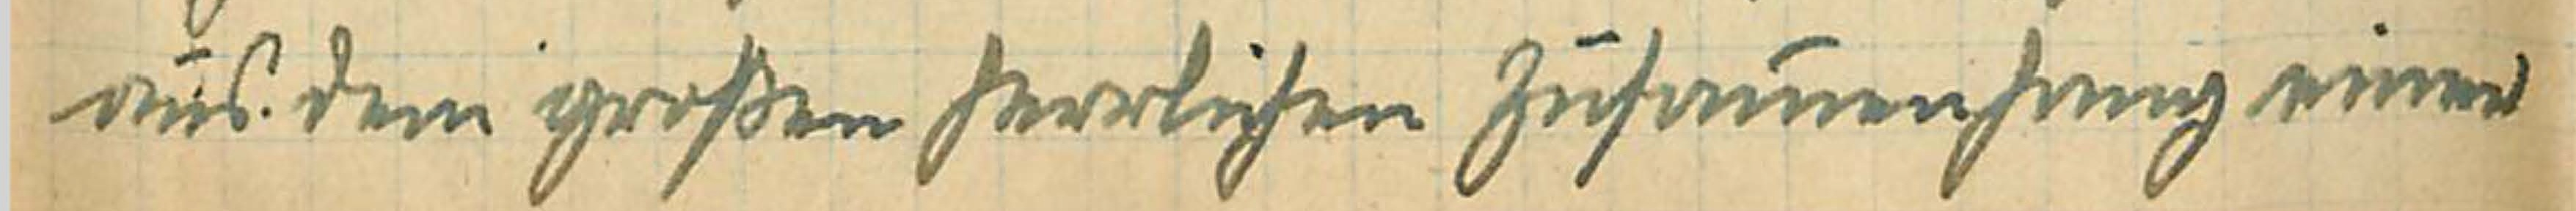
aus dem großen herrlichen Zusammenhang einer
